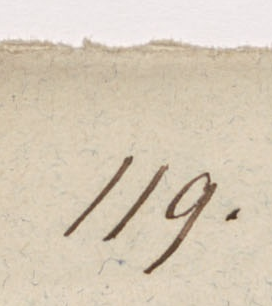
119.
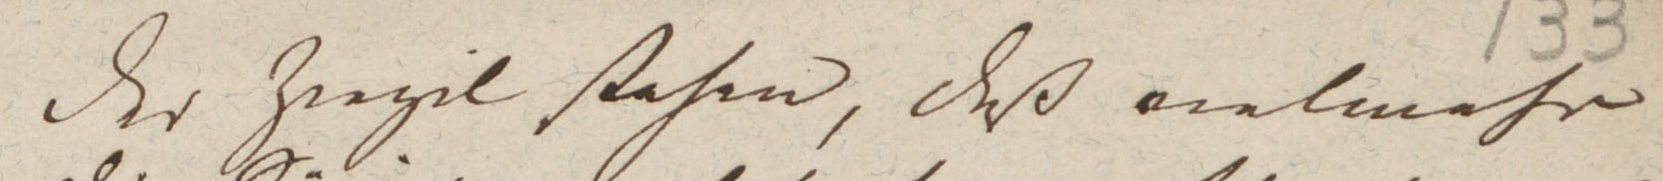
der Ziegel stehen, dass vielmehr
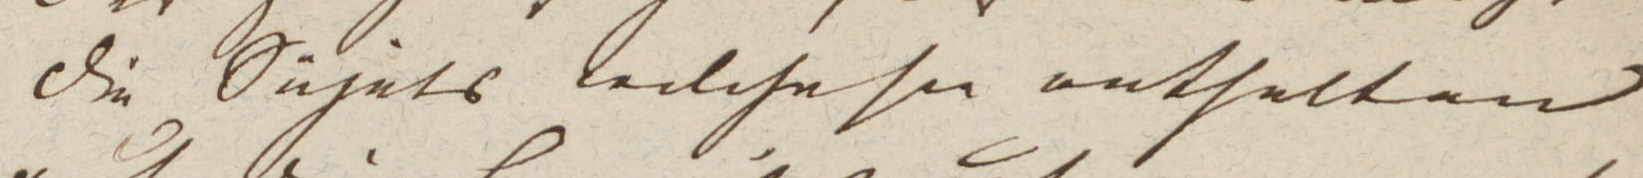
die Süjets sie enthalten
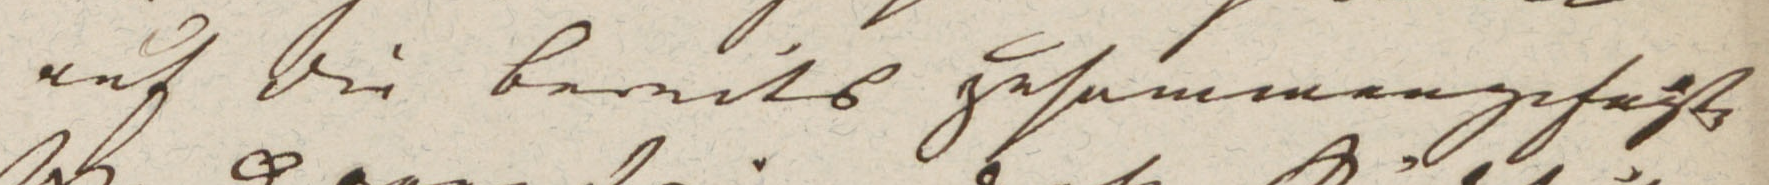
auf die bereits zusammengefügte
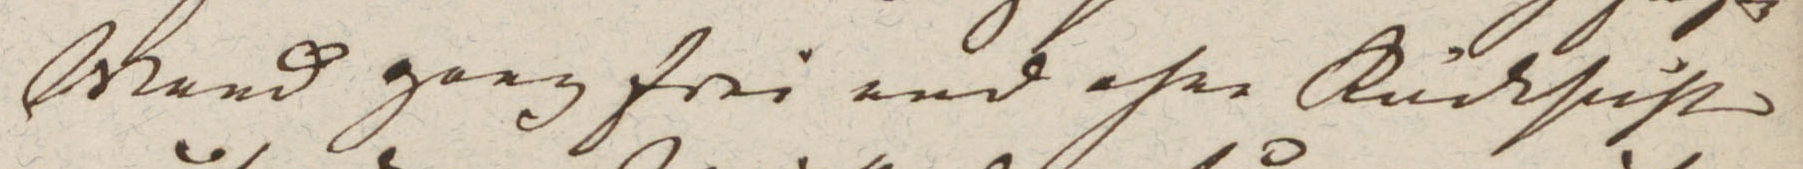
Wand ganz frei und ohne Rücksicht
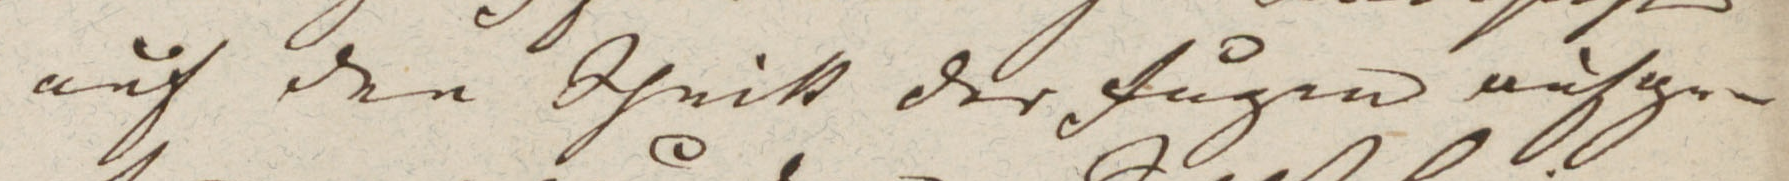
auf den Schnitt der Fugen aufge-
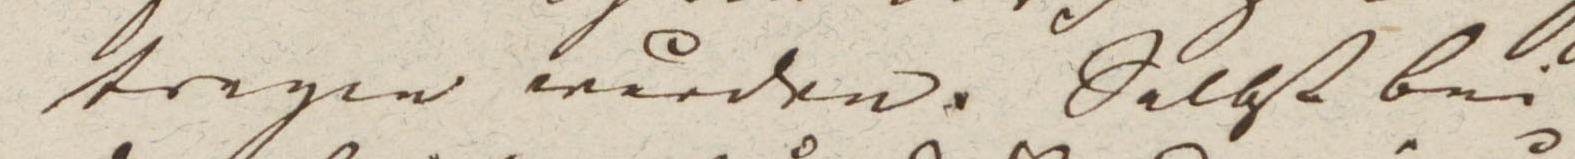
tragen wurden. Selbst bei
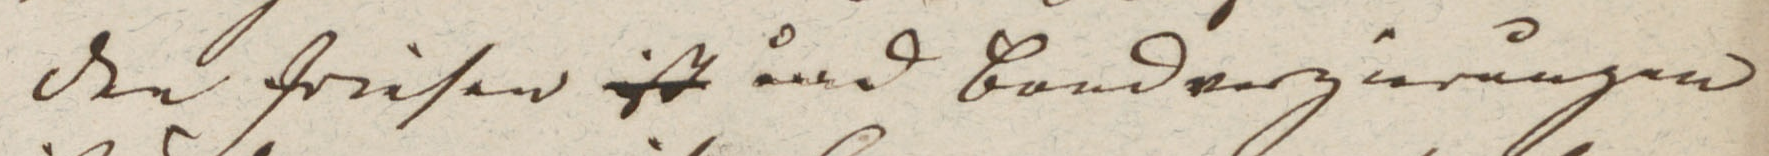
den Friesen ist und Bandverzierungen
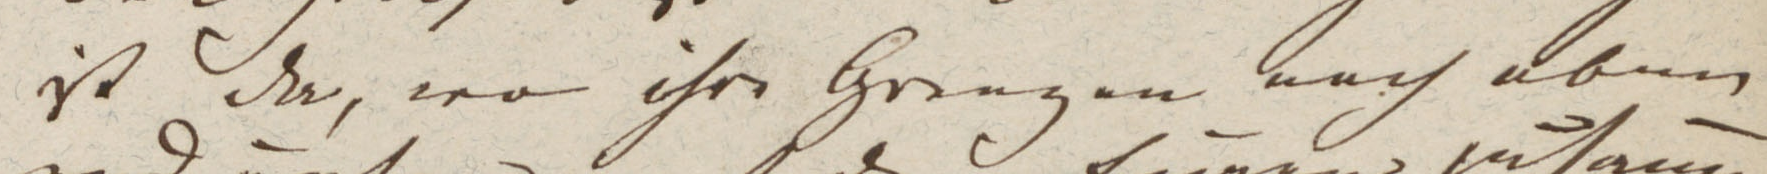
ist da, wo ihre Grenzen nach oben
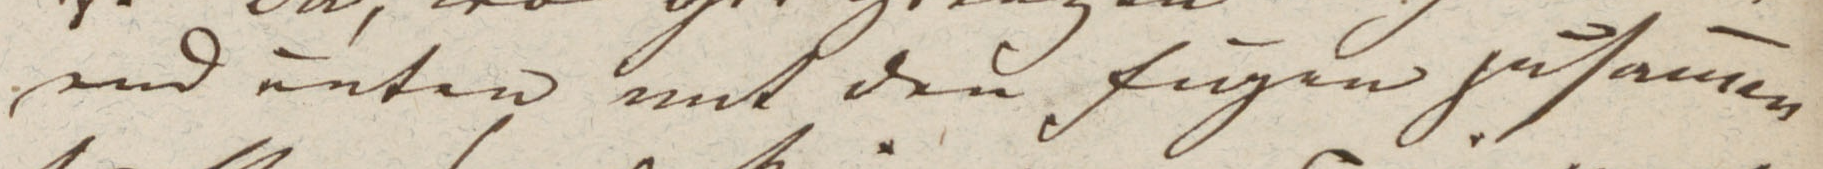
und unten mit den Fugen zusammen
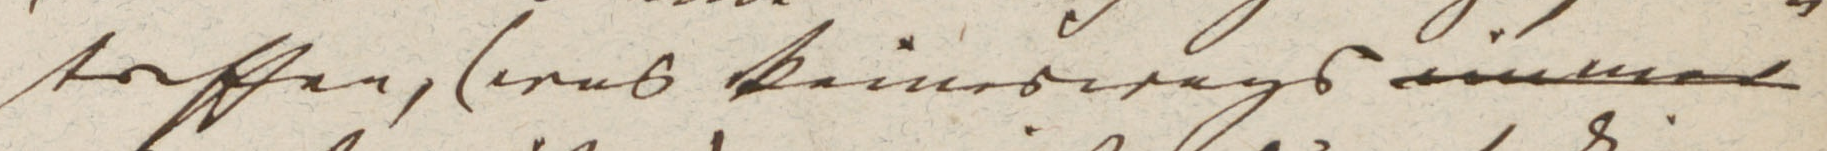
treffen, (was keineswegs immer
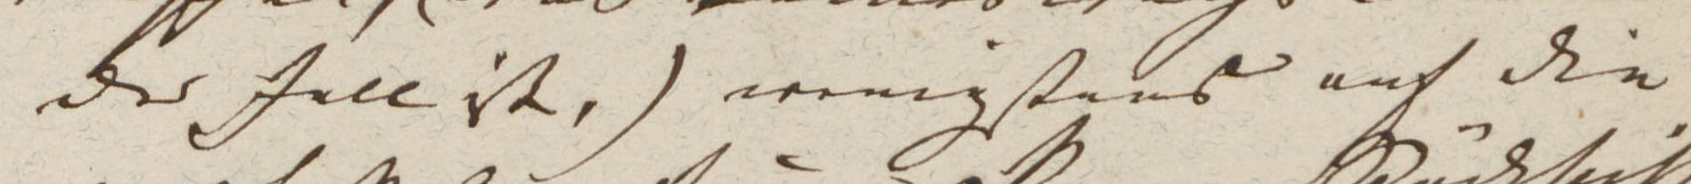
der Fall ist,) wenigstens auf die
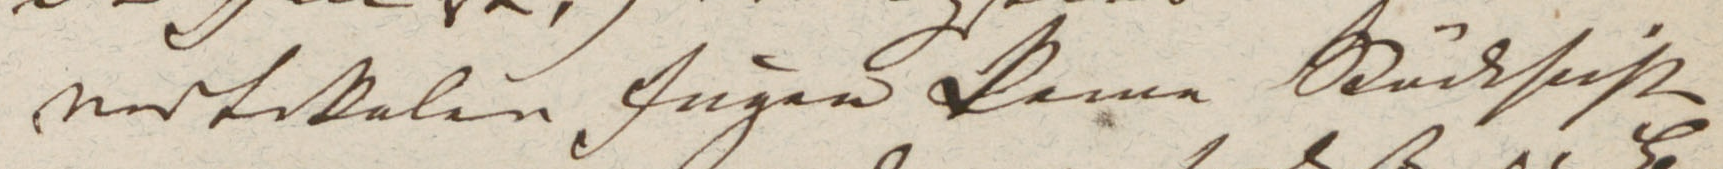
vertikalen Fugen keine Rücksicht
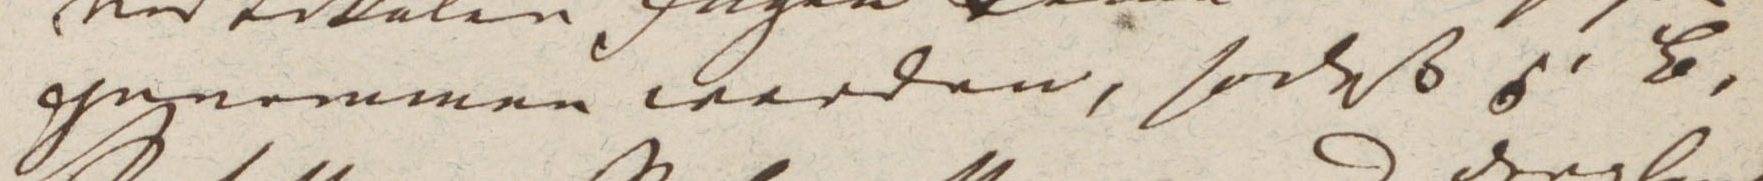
genommen worden, sodass z. B.
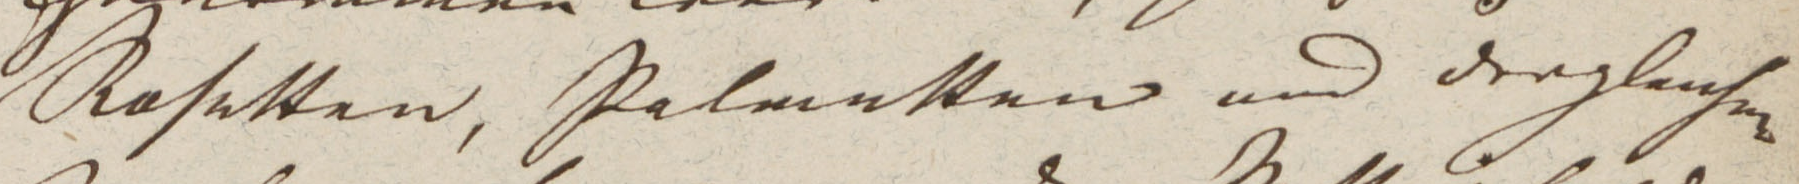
Rosetten, Palmetten und dergleichen
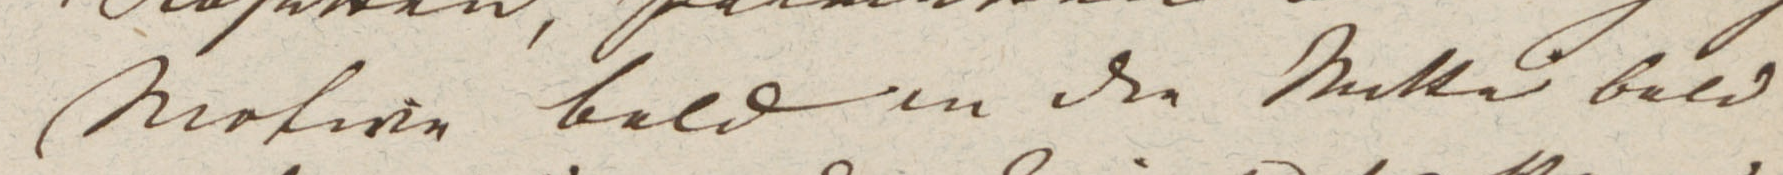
Motive bald in die Mitte bald
